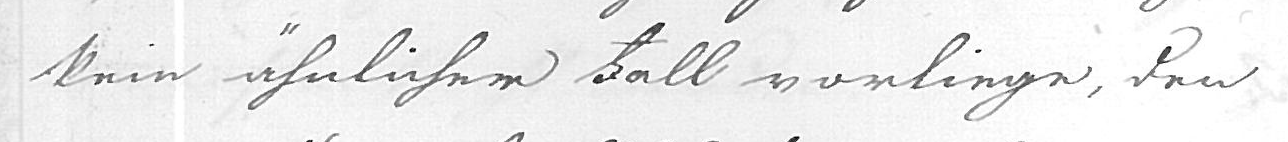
kein ähnlicher Fall vorliege, den
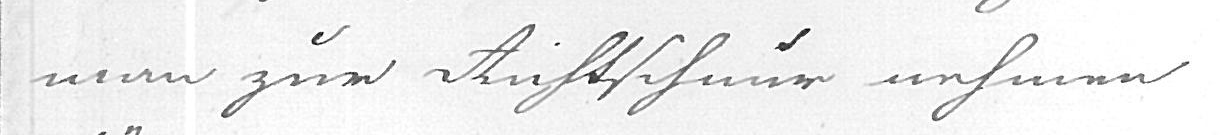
man zur Richtschnur nehmen
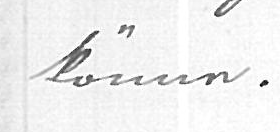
könne.
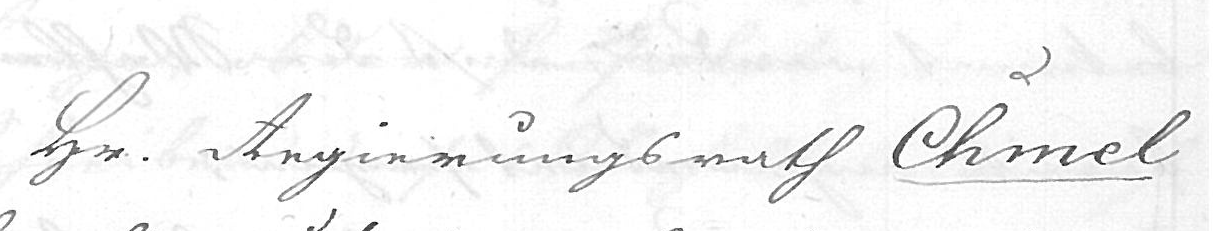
Hr. Regierungsrath Chmel
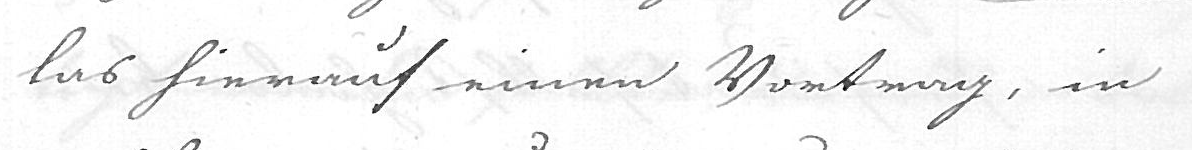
las hierauf einen Vortrag, in
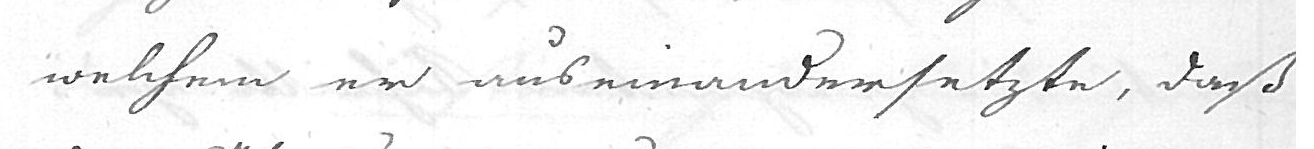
welchem er auseinandersetzte, daß
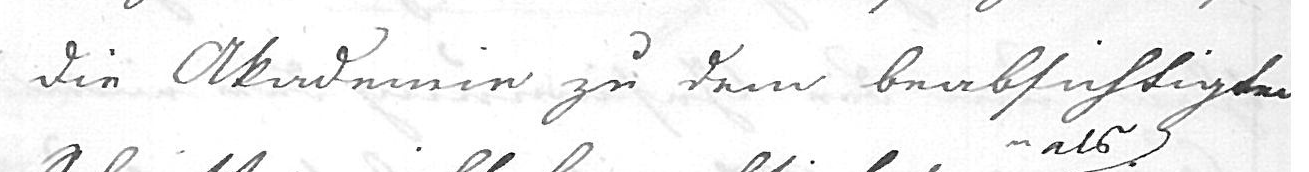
die Akademie zu dem beabsichtigten
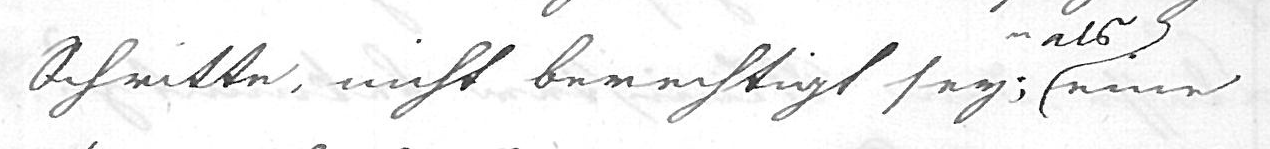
Schritte, nicht berechtigt sey; als eine
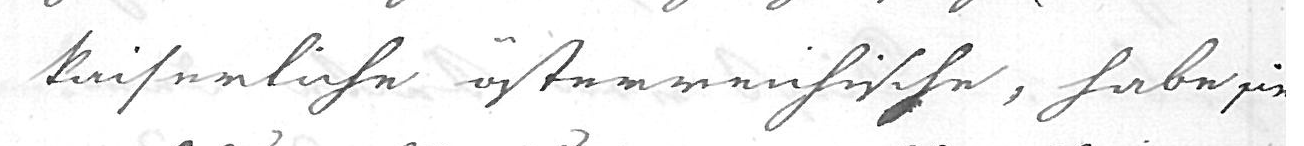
kaiserliche österreichische, habe sie
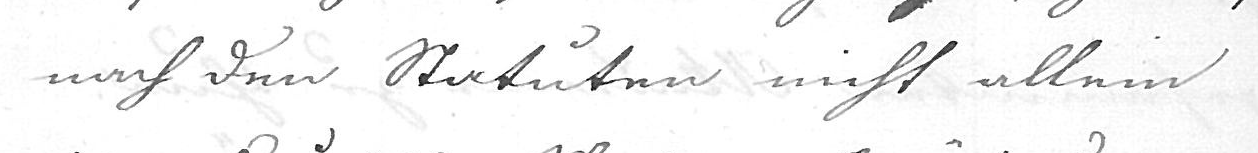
nach den Statuten nicht allein
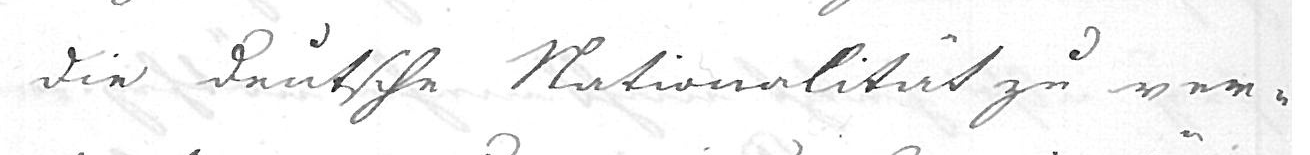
die deutschen Nationalitat zu ver-
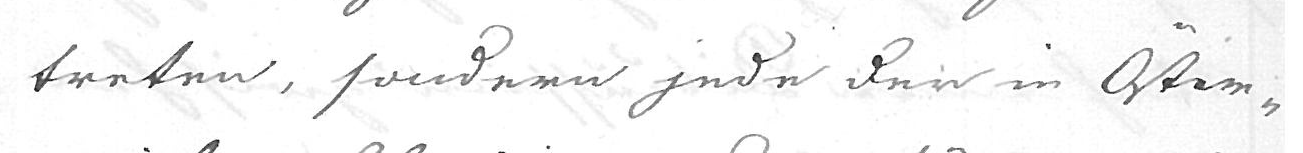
treten, sondern jede der in Öster-
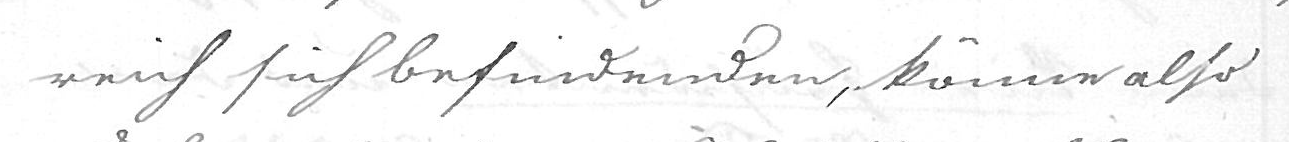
reich sich befindenden, könne also
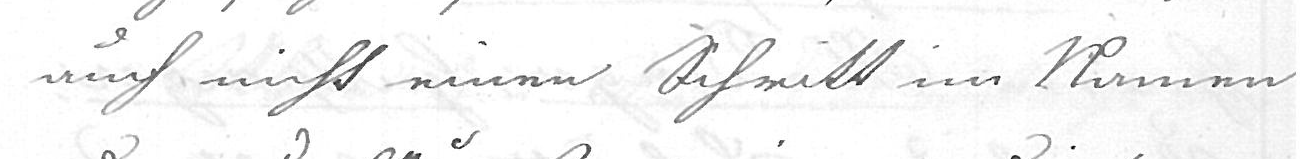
auch nicht einen Schritt im Namen
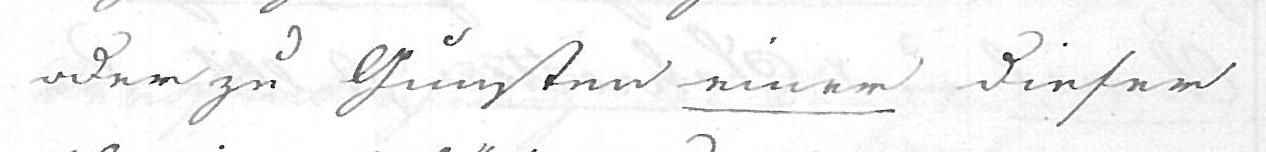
oder zu Gunsten einer dieser
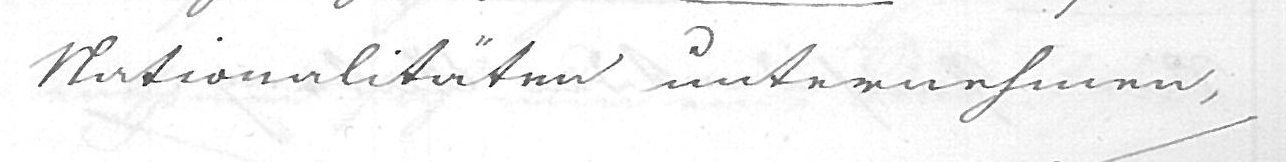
Natonalitäten unternehmen,
